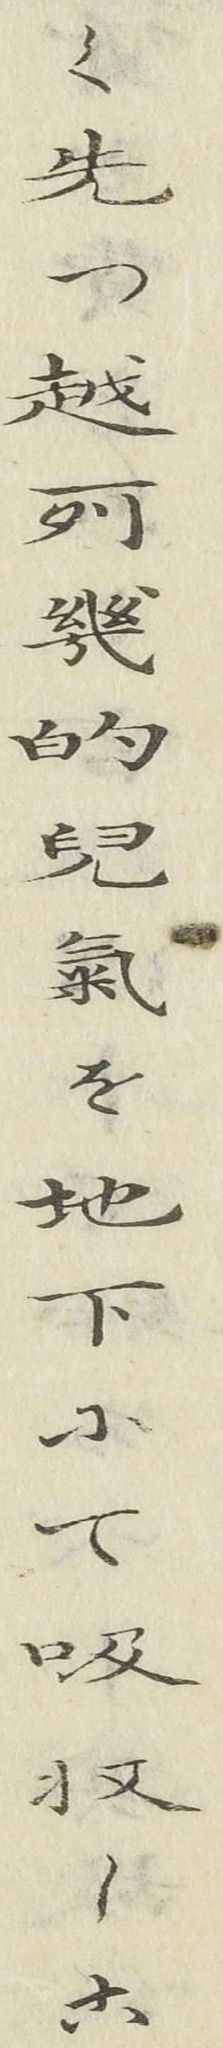く先つ越列幾児気を地下にて吸収しこ
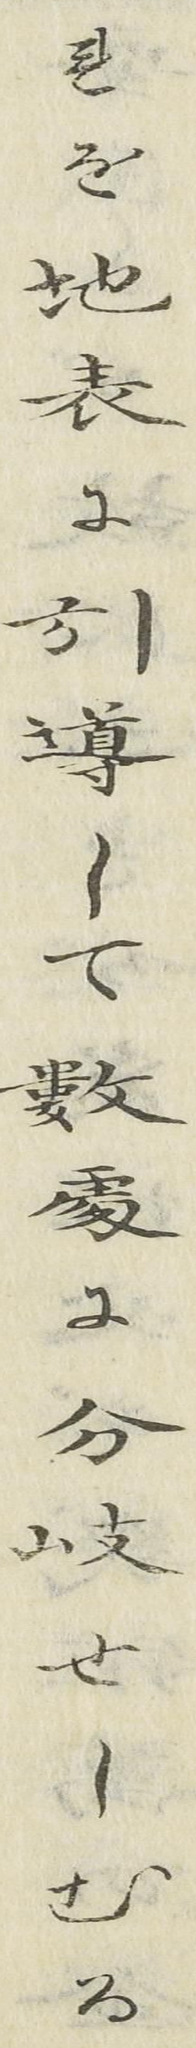れを地表に引導して数処に分岐せしむる
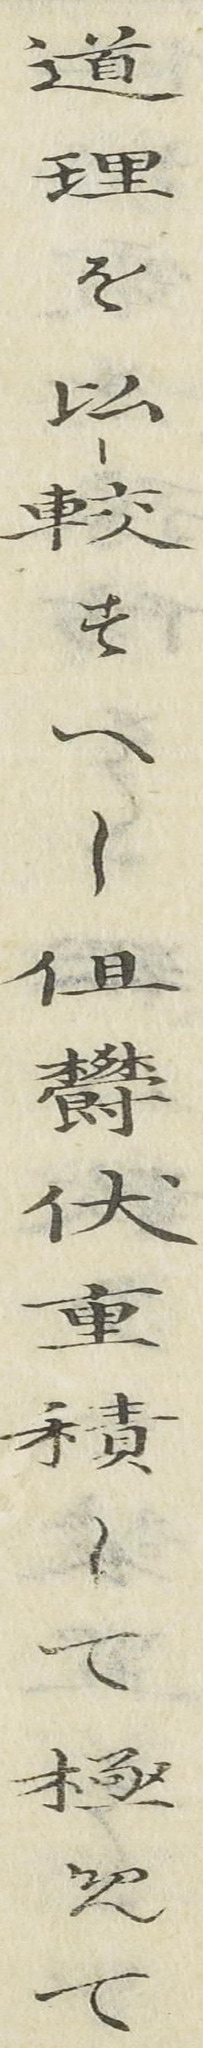道理を比－較すへし但鬱伏重積して極めて
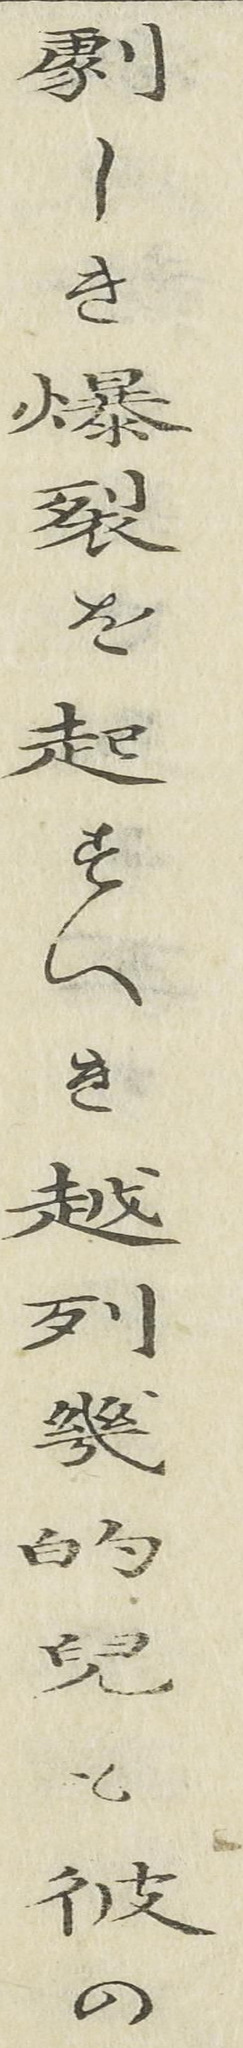劇しき爆裂を起すへき越列幾的児も彼の
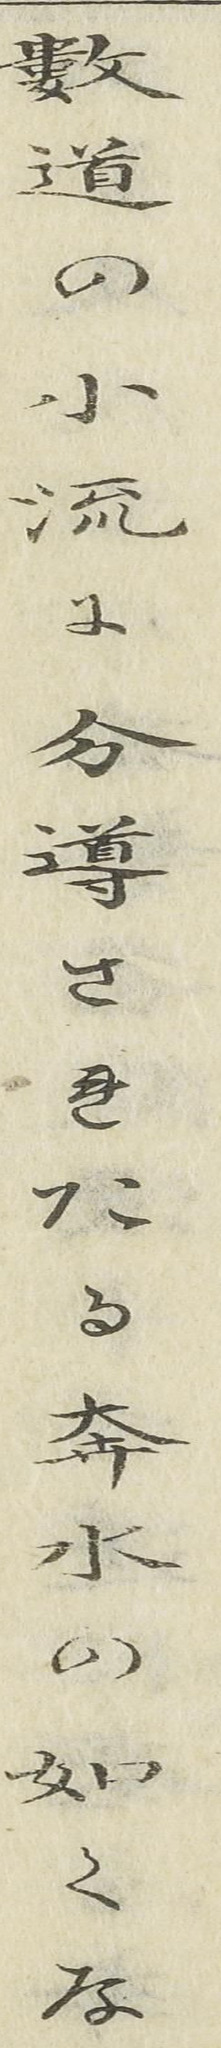数道の小流に分導されたる奔水の如くな
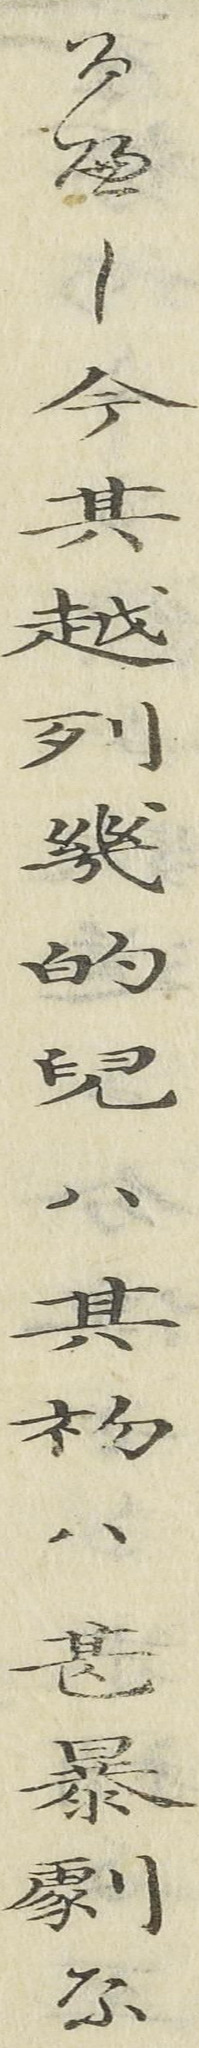るへし今其越列幾的児は其初は甚暴劇な

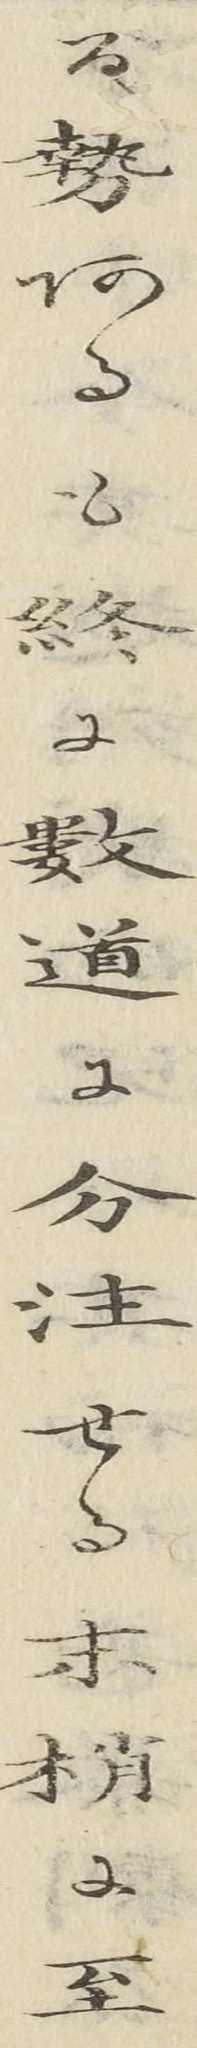る勢あるも終に数道に分注せる末梢に至
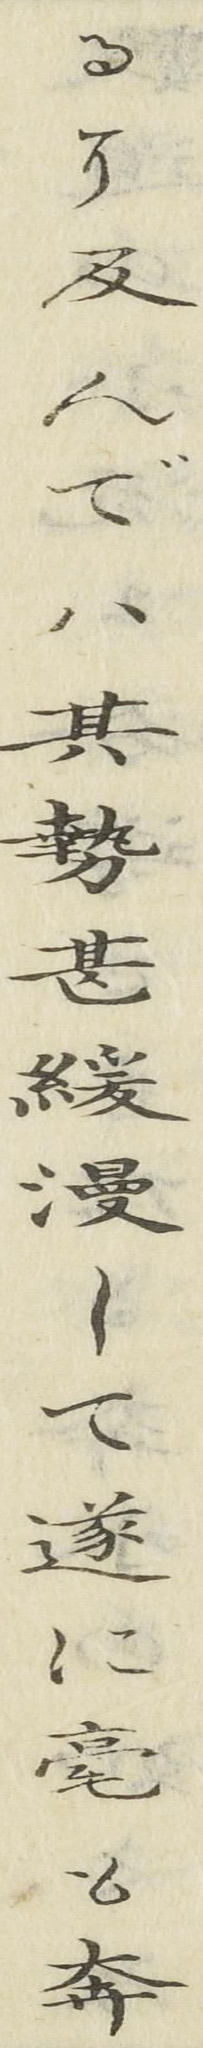るに及んでは其勢甚緩慢して遂に毫も奔
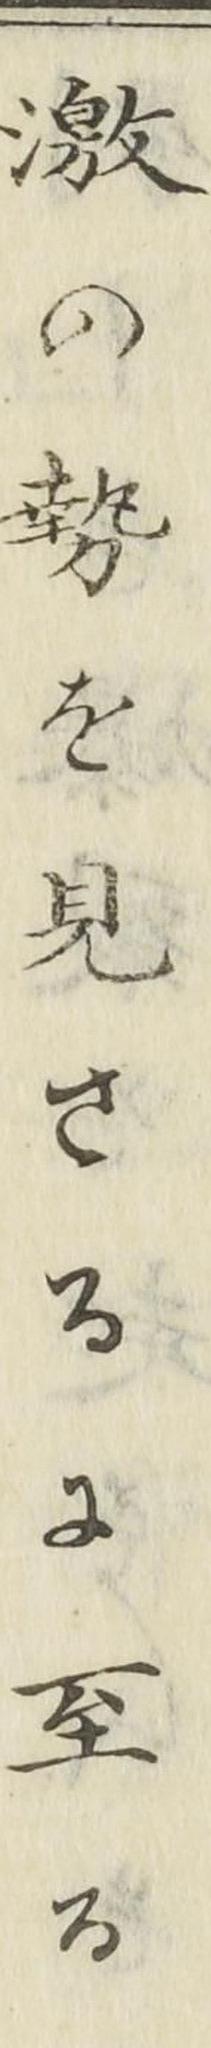激の勢を見さるに至る
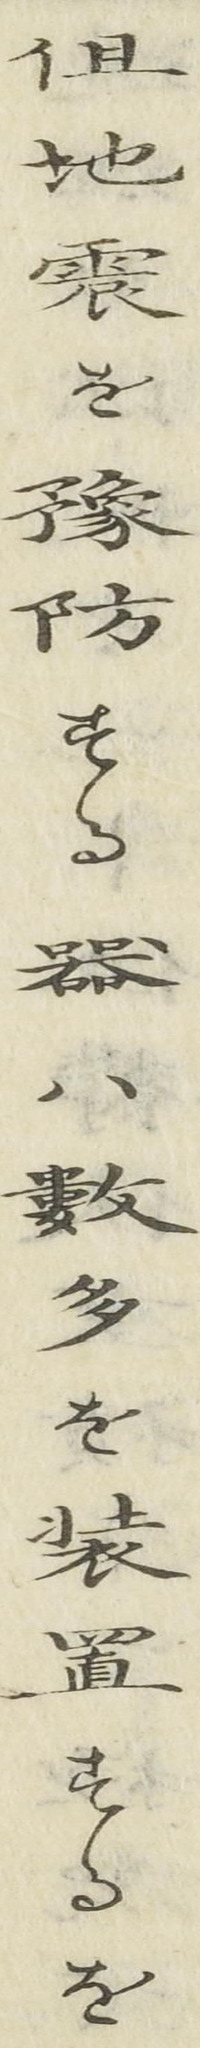且地震を予防する器は数多を装置するを
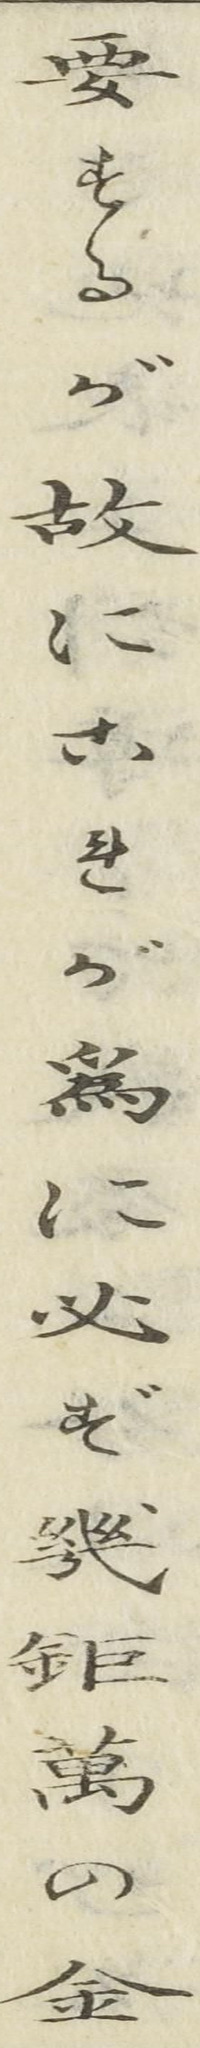要するが故にこれが為に必ず幾鉅万の金
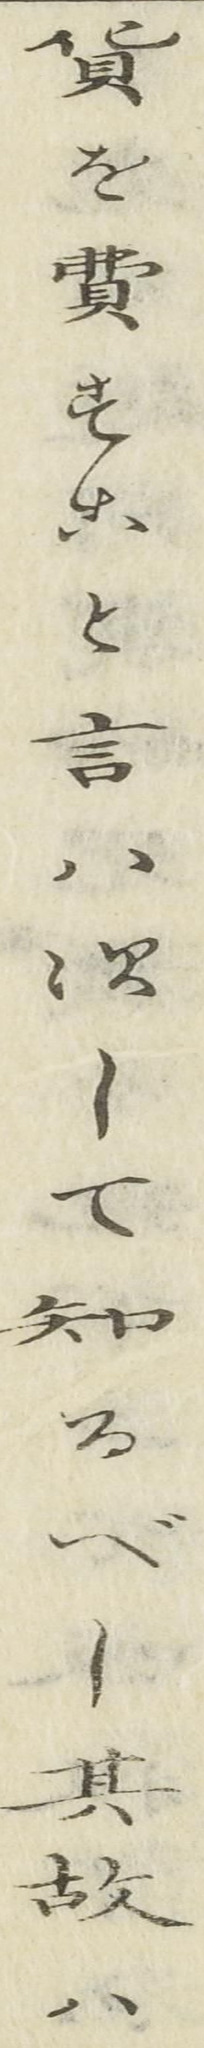貨を費すこと言わすして知るべし其故は
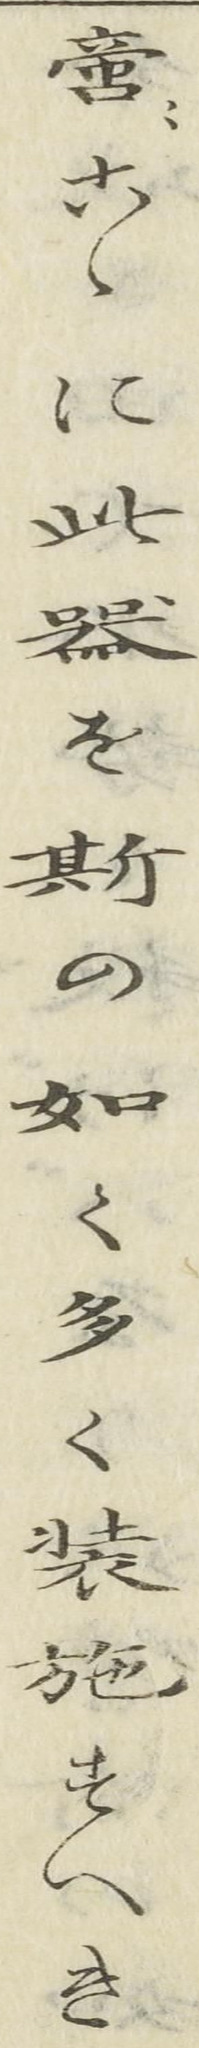啻にここに此器を斯の如く多く装施すべき
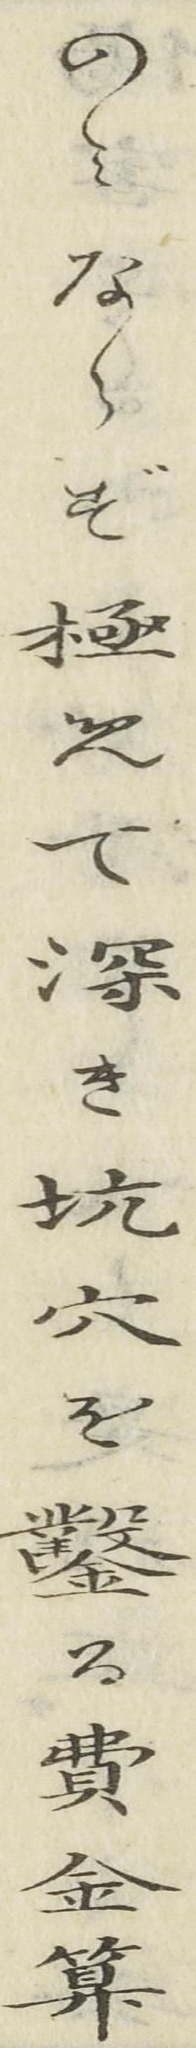のみなくぞ極めて深き坑穴を鑿る費金算
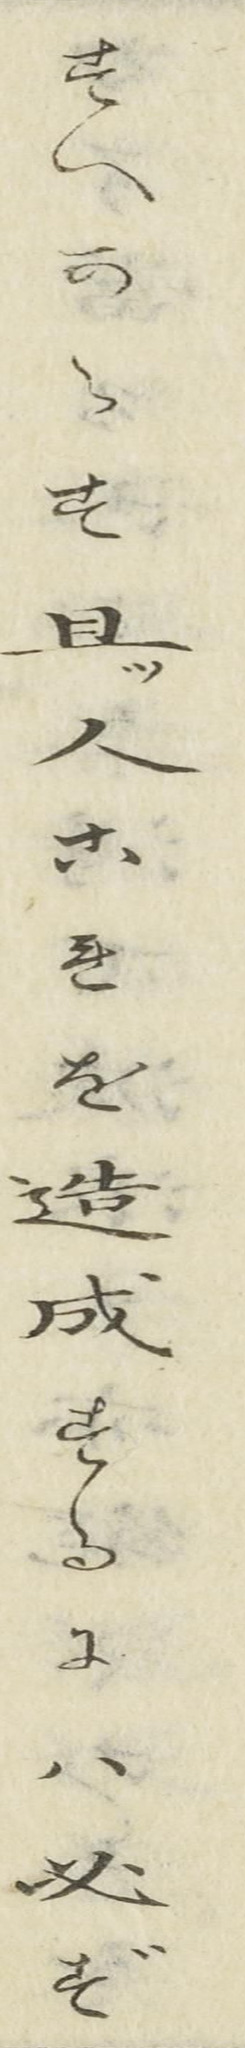すべからす且つ人これを造成するには必ず
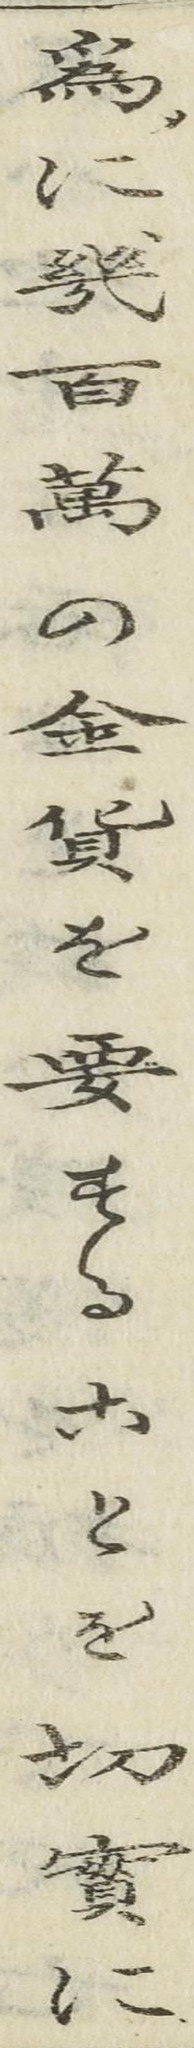為めに幾百万の金貨を要することを切実に
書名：地震預防説
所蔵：東京大学地震研究所図書室 Earthquake Research Institute Library, The University of Tokyo, JAPAN
